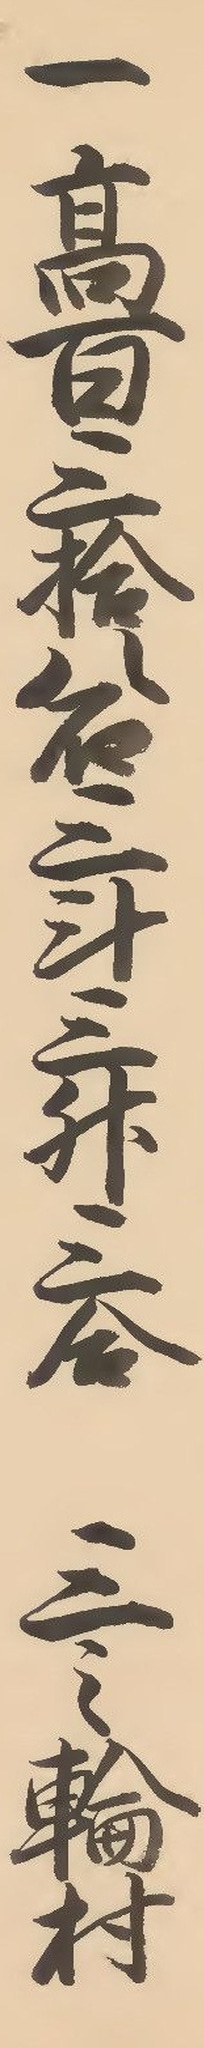一高百三拾八石三斗三升三合三之輪村
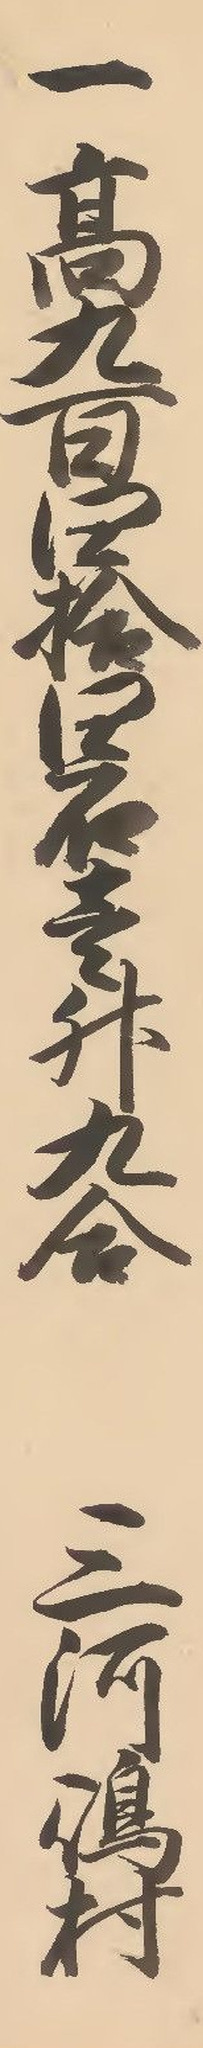一高九百四拾四石壱升九合三河嶋村
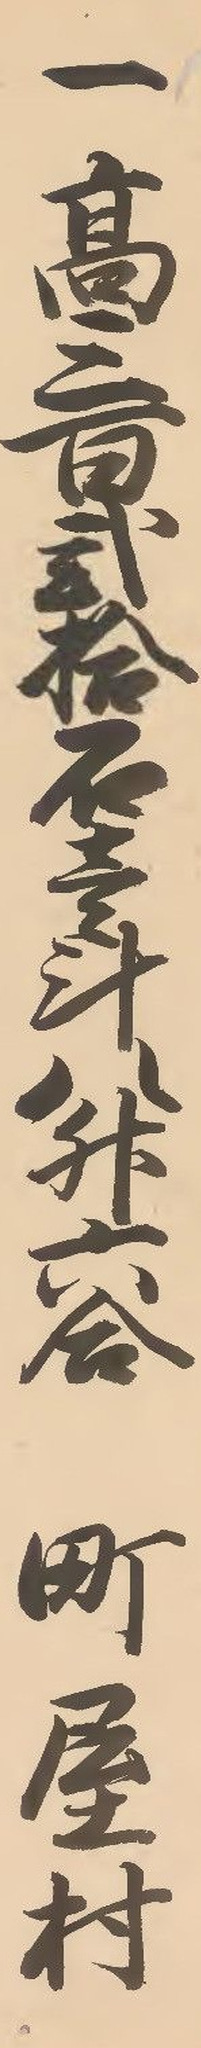一高三百弐拾石壱斗八升六合町屋村
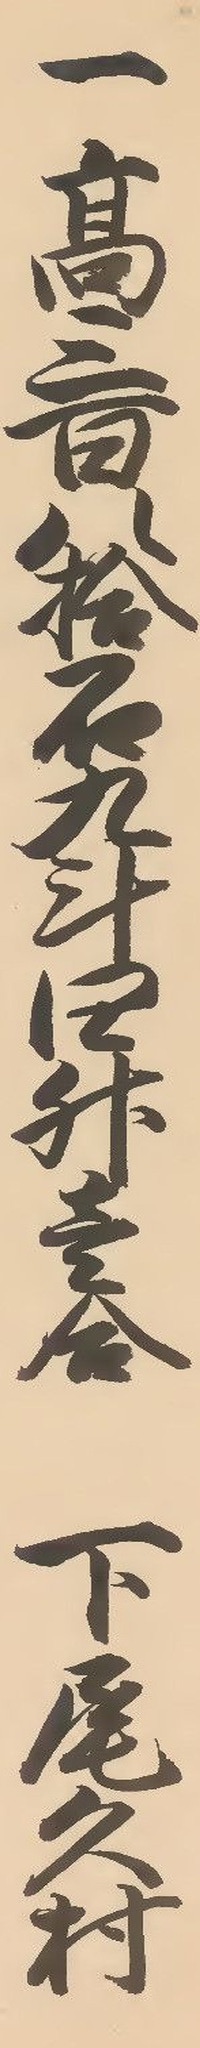一高三百八十石九斗四升壱合下尾久村
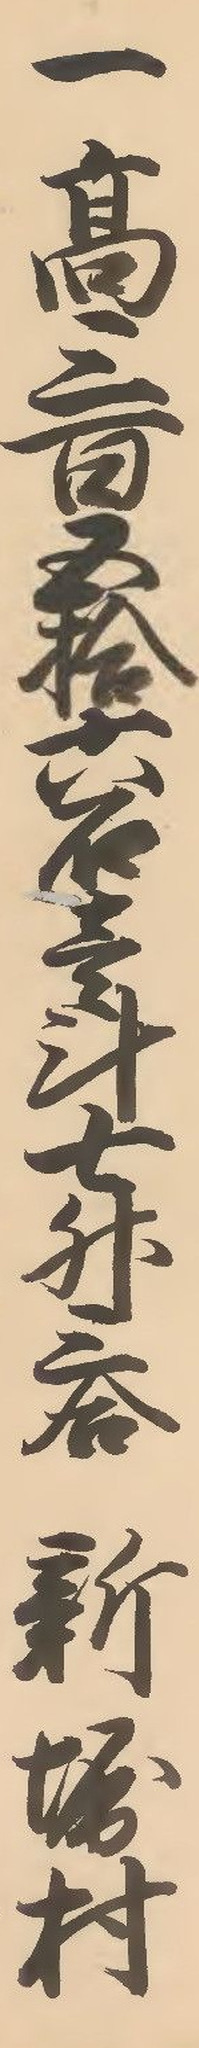一高三百五拾六石壱斗七升三合新堀村

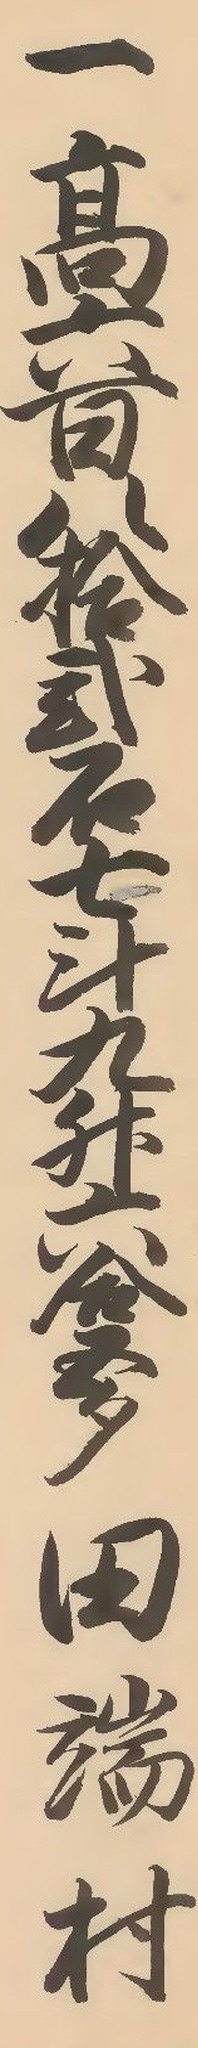一高六百八拾弐石七斗九升六合五勺田端村
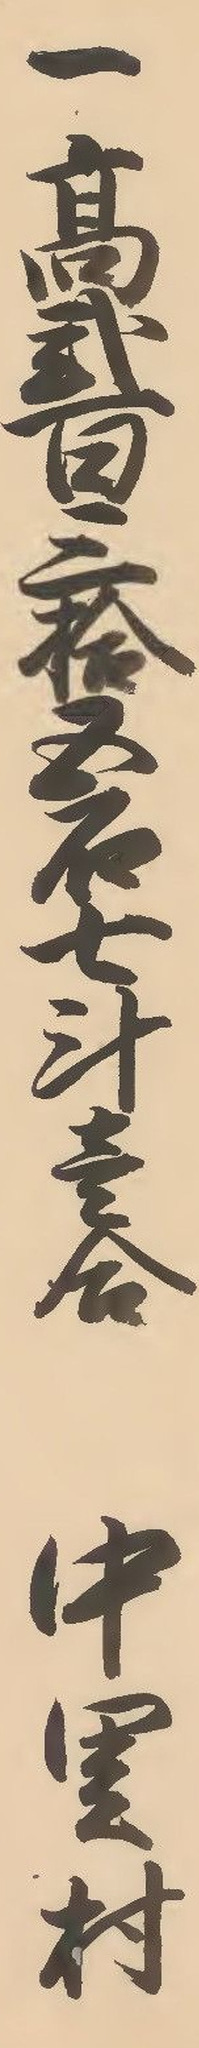一高弐百三拾五石七斗壱合中里村
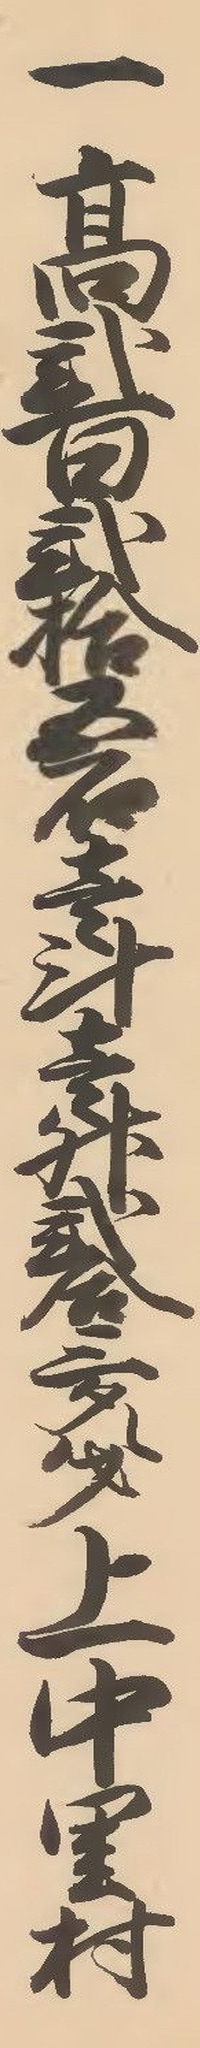一高弐百弐拾五石壱斗壱升弐合三勺八才上中里村
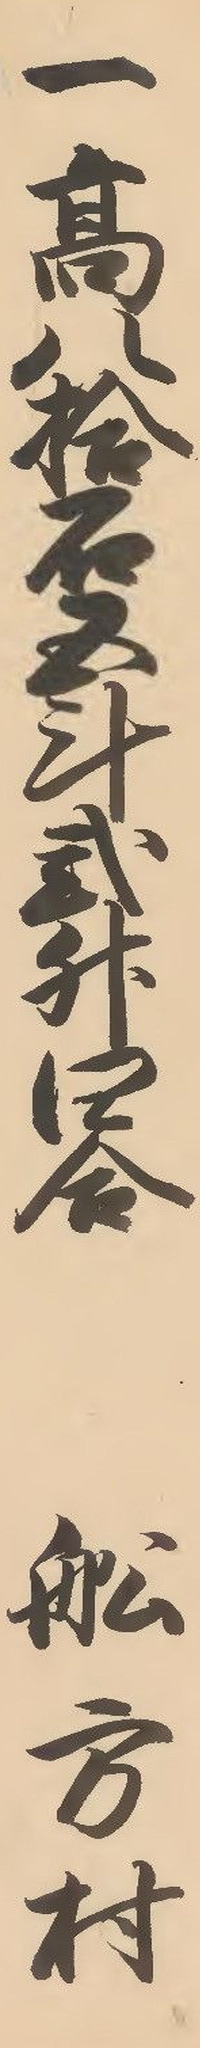一高八拾石五斗弐升四合船方村
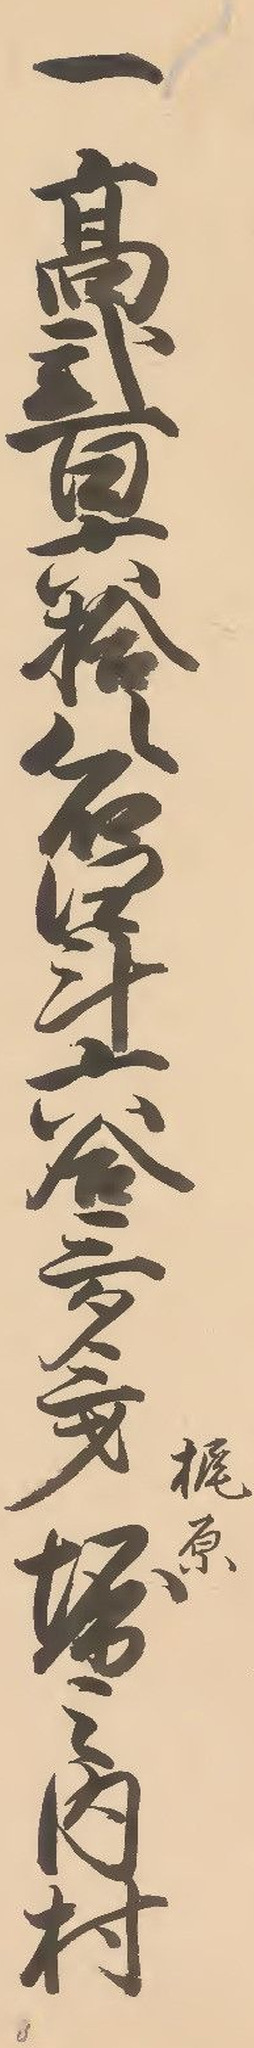一高弐百六拾八石四斗六合三勺三才堀之内村
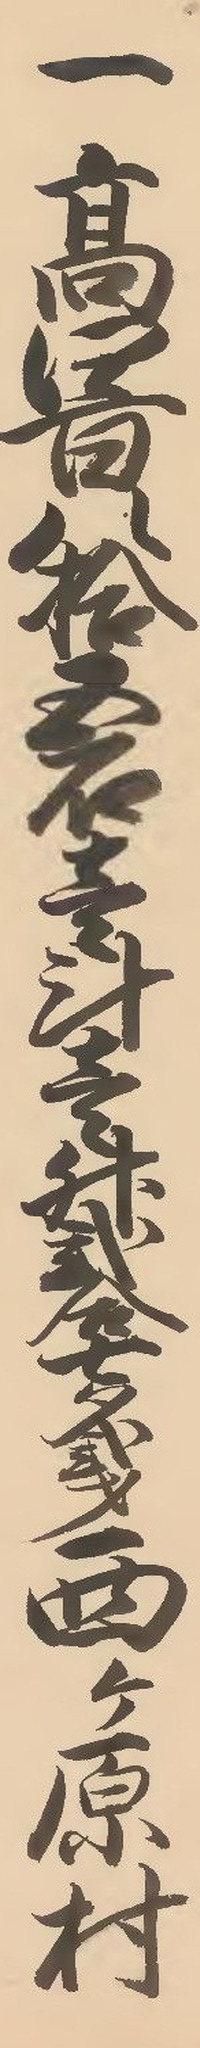一高四百八拾五石壱斗壱升弐合七勺弐才西ヶ原村
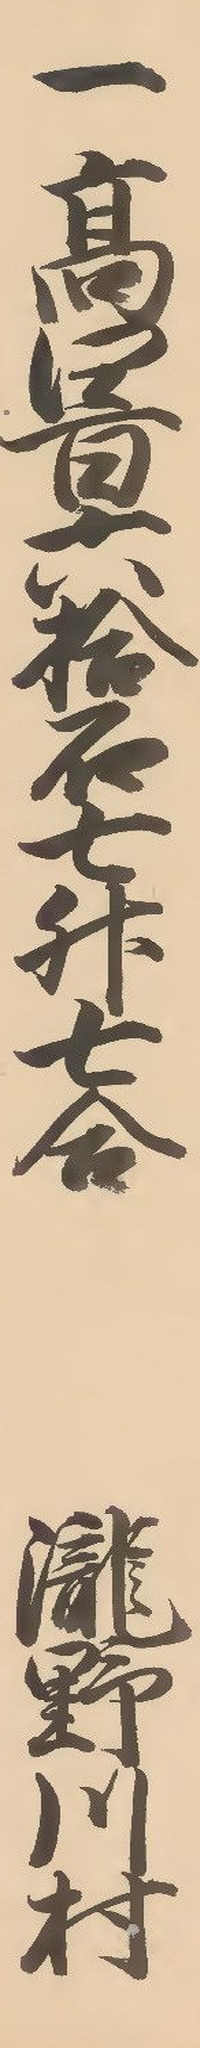一高四百六拾石七升七合瀧野川村

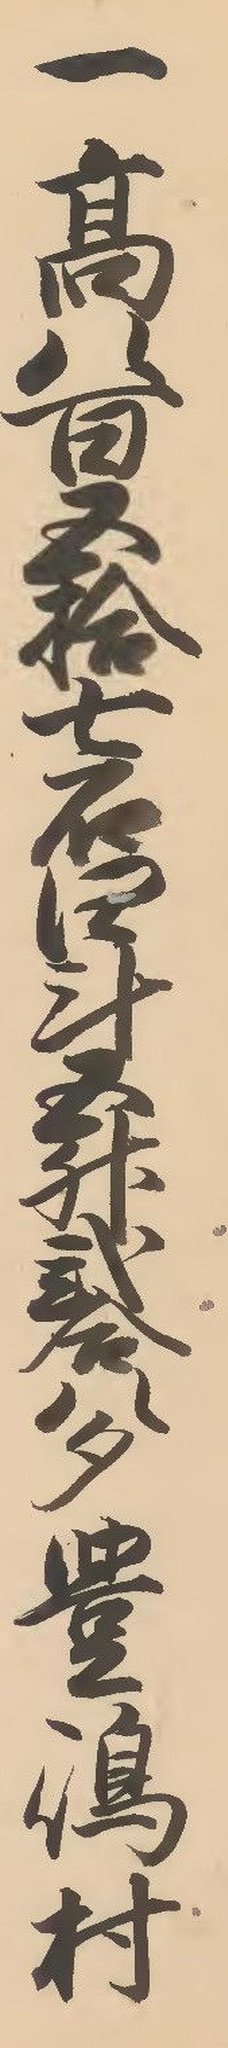一高八百五拾七石四斗五升弐合八勺豊嶋村
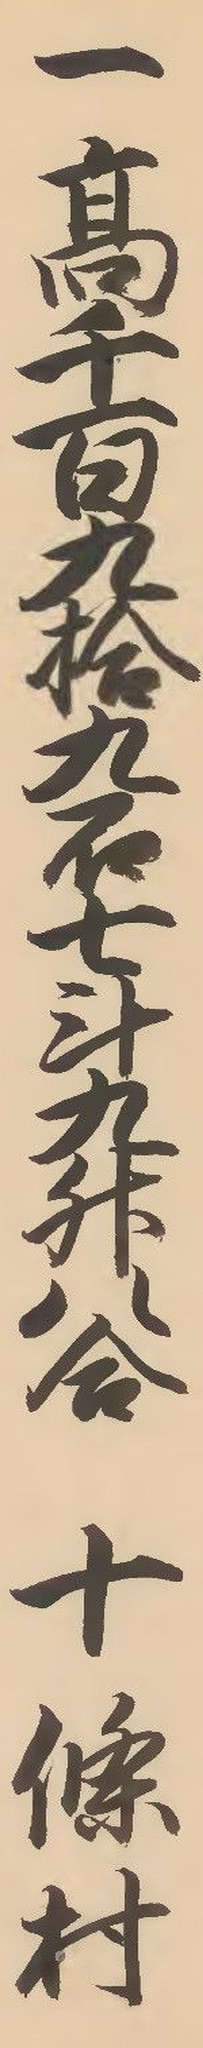一高千百九拾九石七斗九升八合十條村
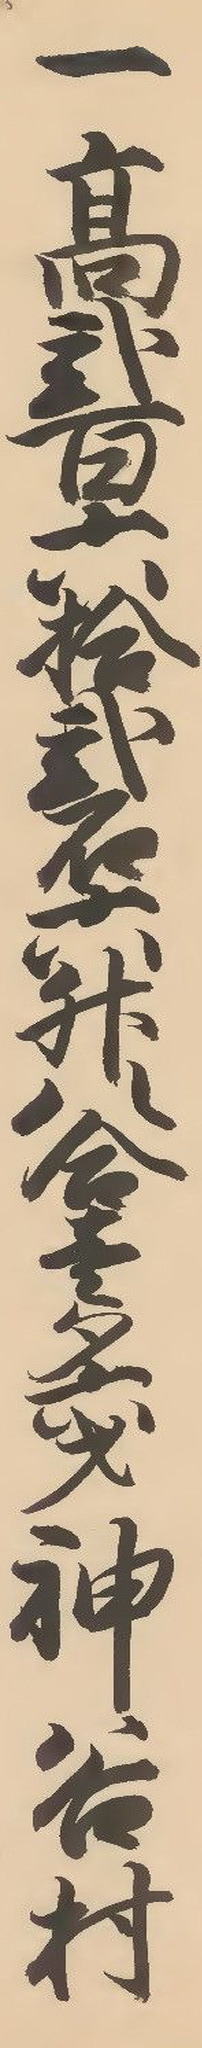一高弐百六拾六弐石六升八合壱勺六才神谷村
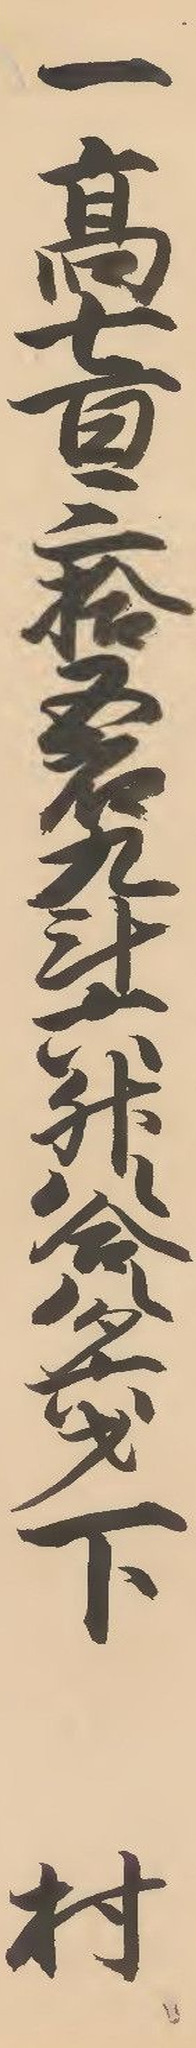一高七百三拾五石九斗六升八合八勺六才下村
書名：武蔵国郷帳　上
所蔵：国立公文書館 National Archives of Japan
